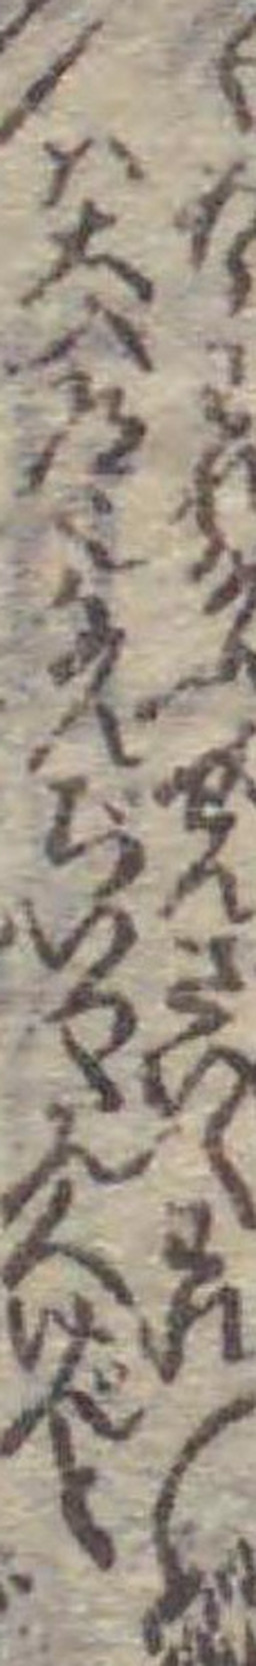は大入道也なんぢいつたん人げんと
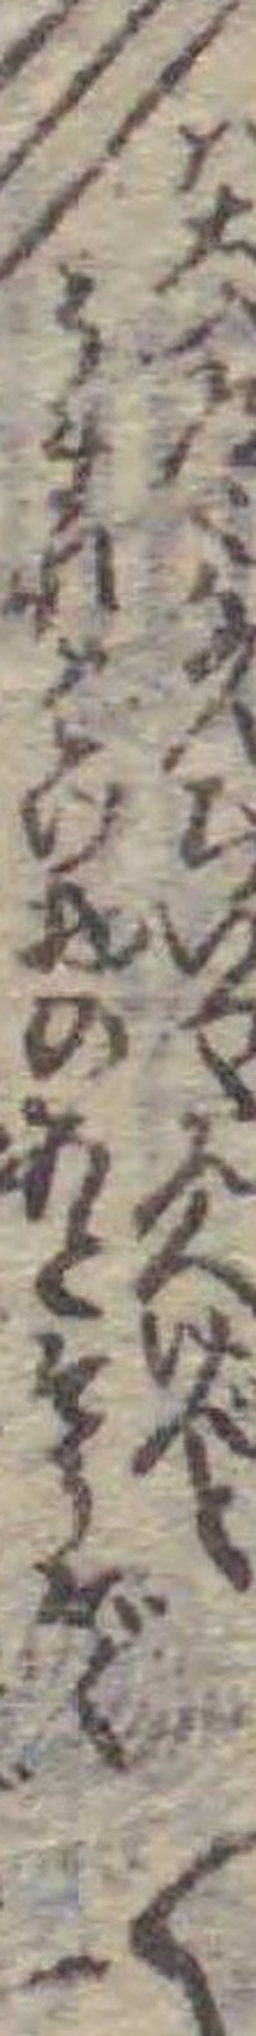うまればけ物のあとそうぞく
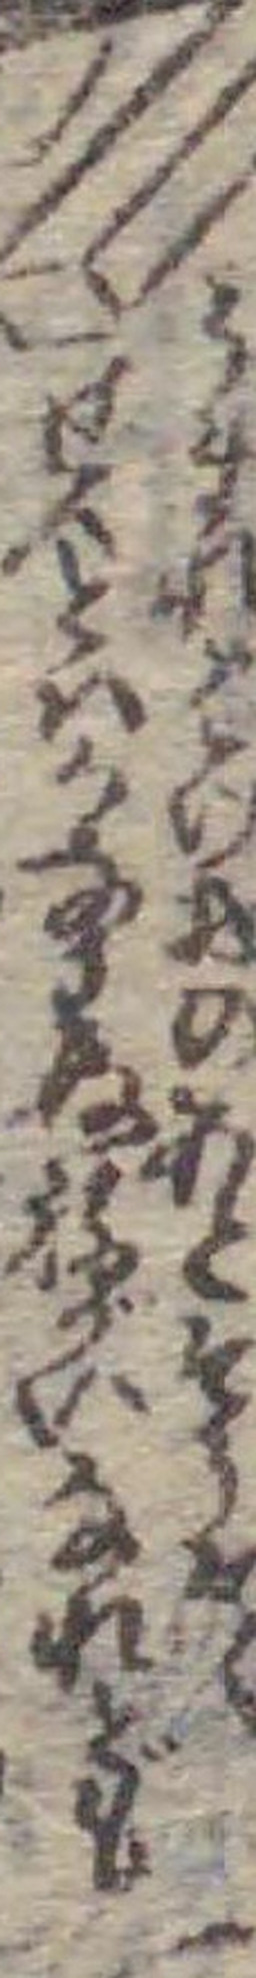せんとはかなわぬねがいなれども
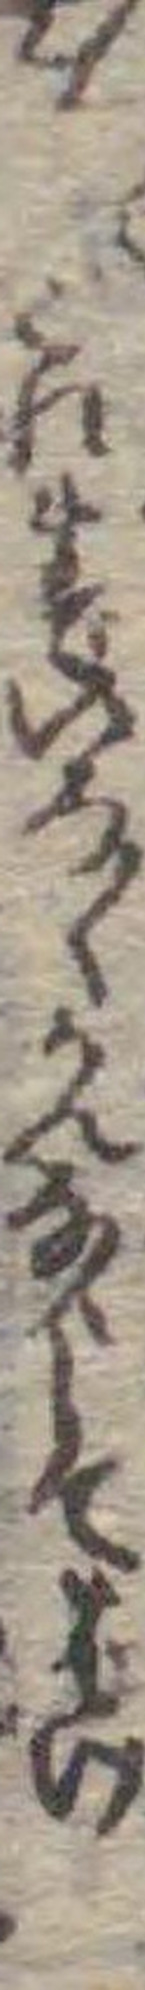これまでいろ〳〵かんなんしてばけ
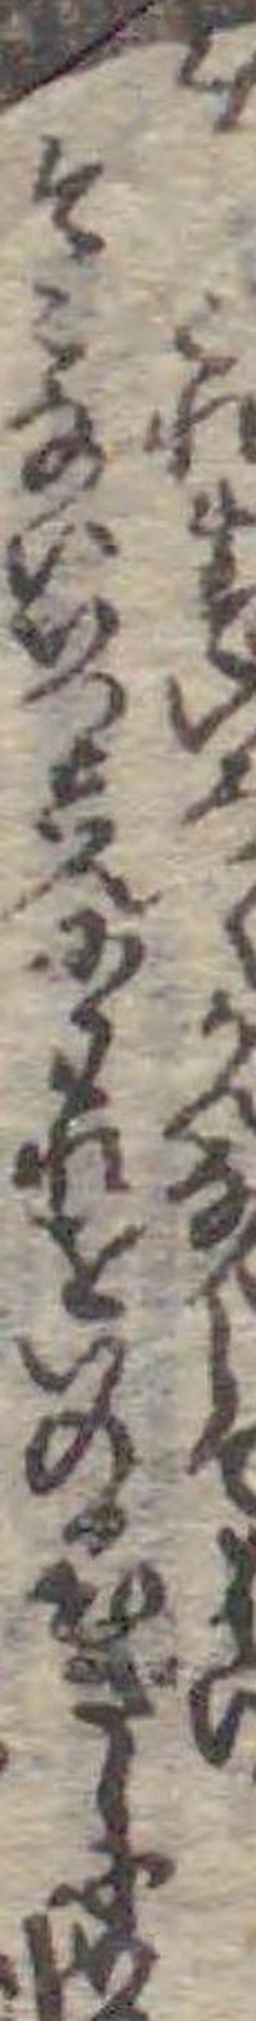そこないいつしんにわれをいのる心ざしにめんじ
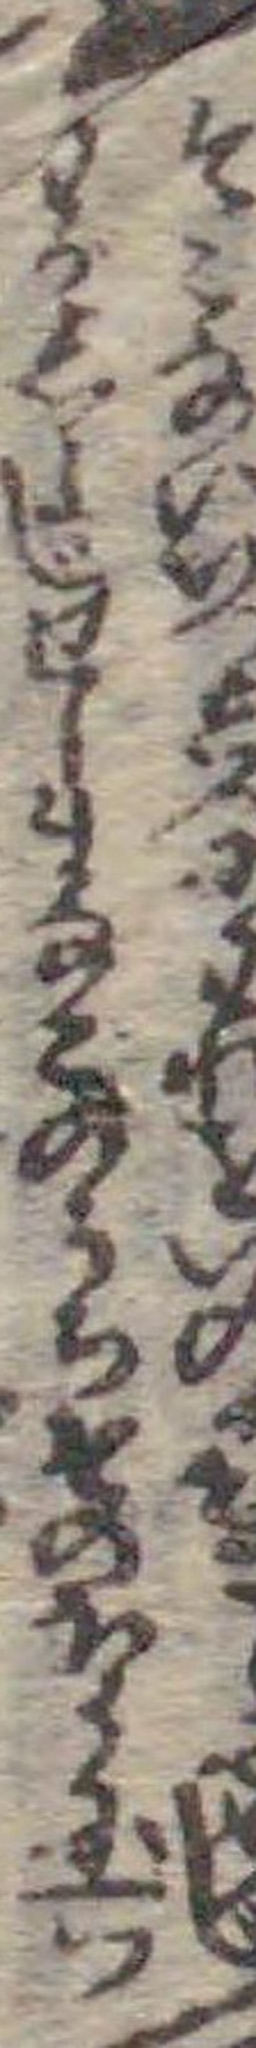わがしよじせしまなこのうちそのほうに一つ
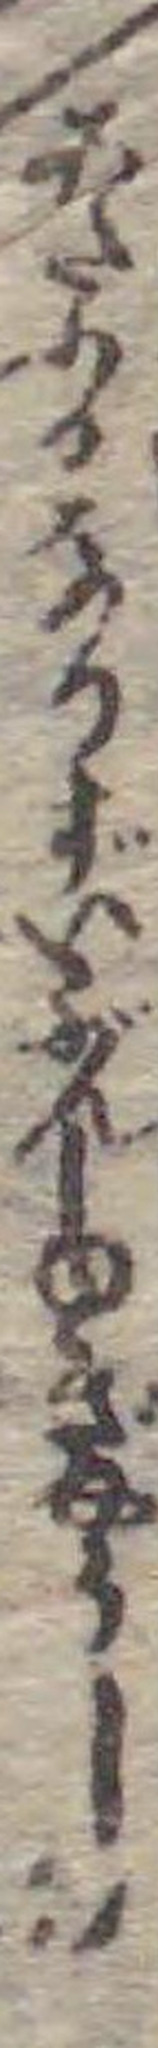あたふるなりずいぶんしゆぎやうし
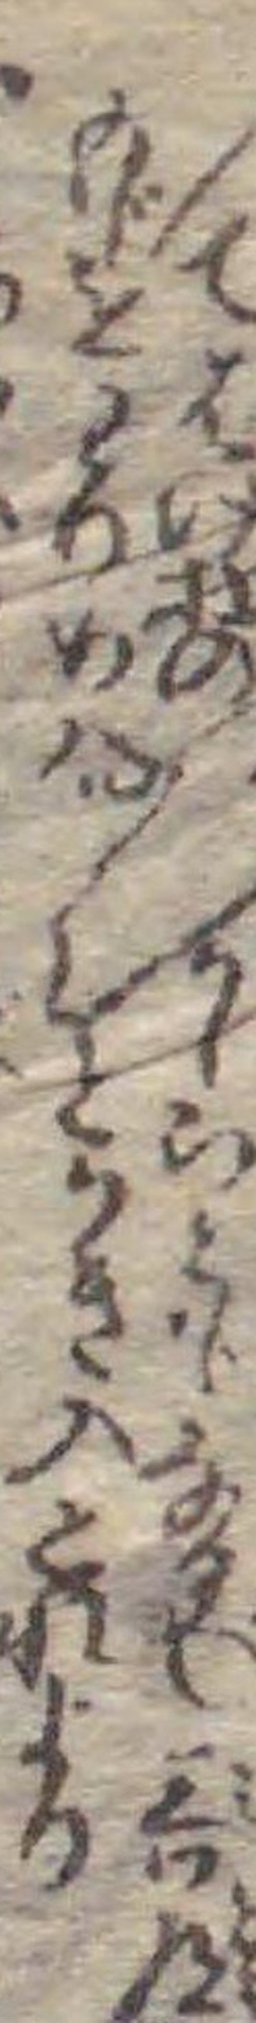もじをわりめ入るとかき入これより
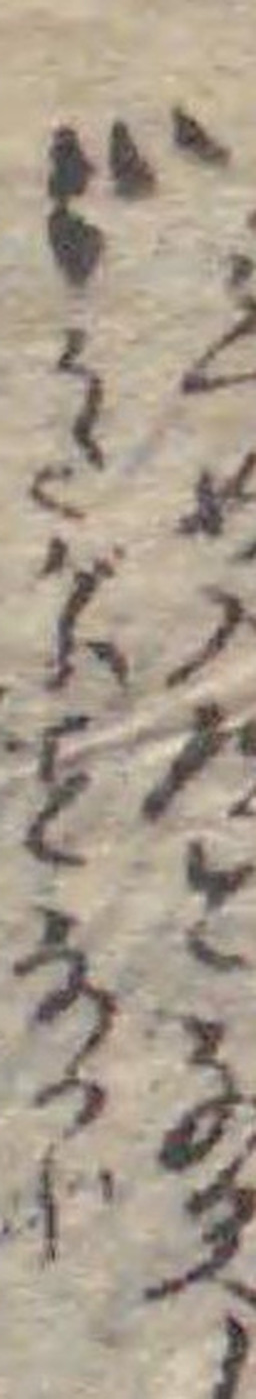うたがふことなかれ
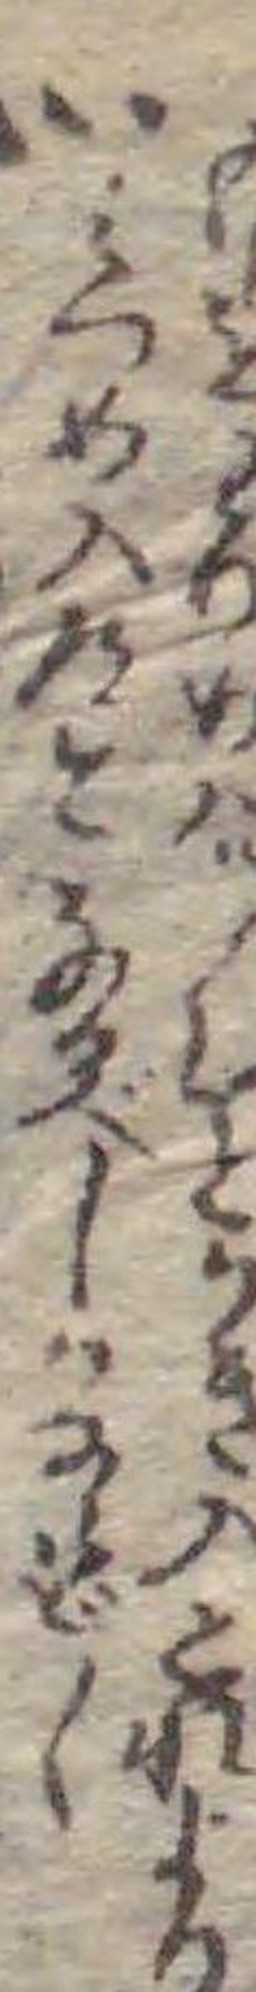三つめ入道となるべしかならず〳〵
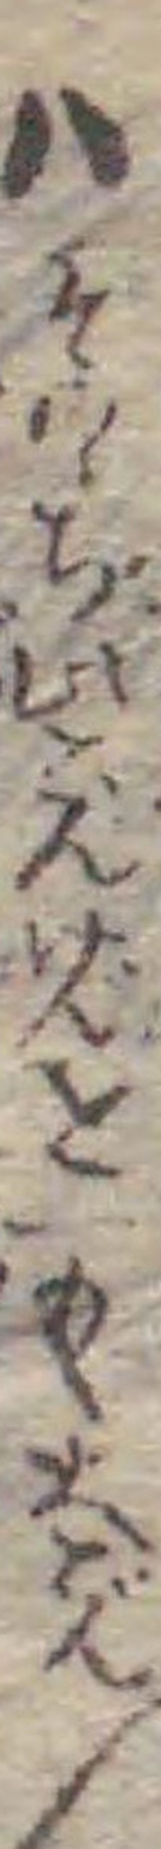そのゝち此ごんげんを一もく大ごん

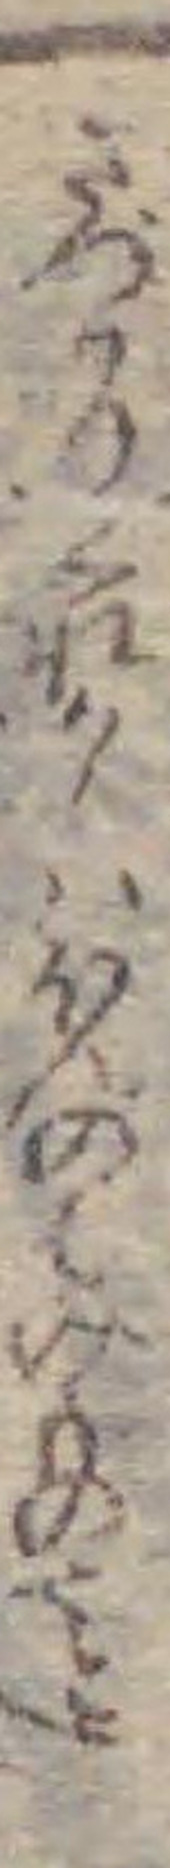さづかりこれからはほんのはけものゝ
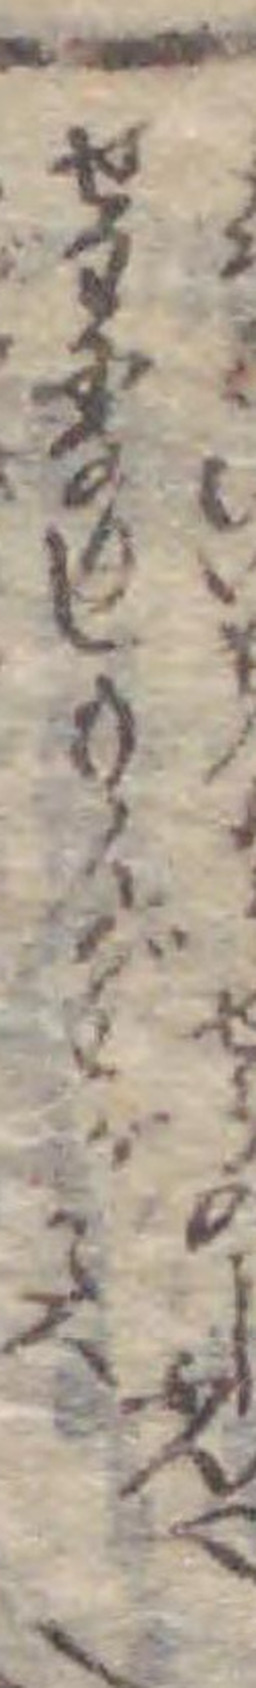せわになりしもゝんぐわがかたへ
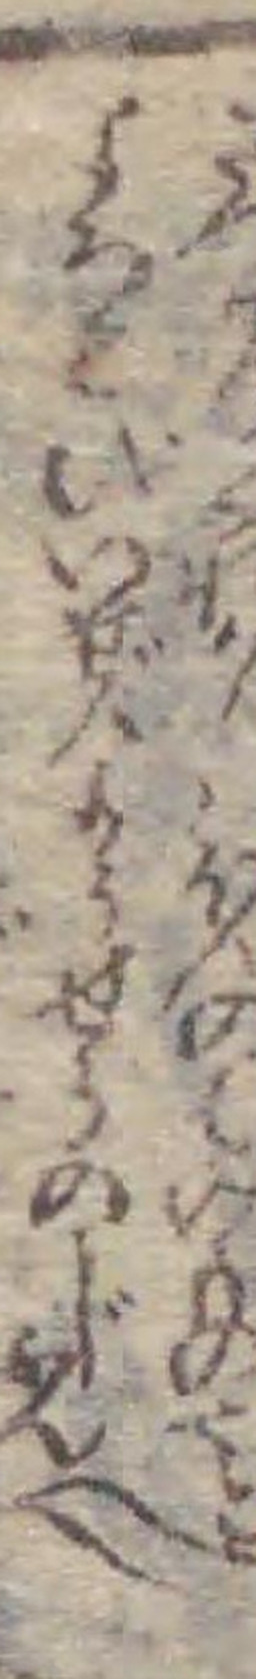よろこびいぜんようせうのじぶん
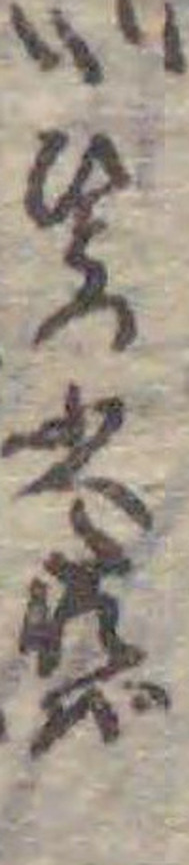ひとつふへたれば
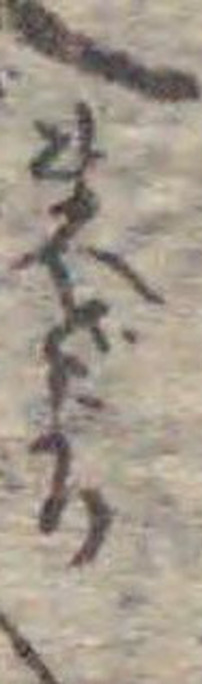まへどより
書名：[化物一代記] : 5巻
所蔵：国立国会図書館 National Diet Library, JAPAN
